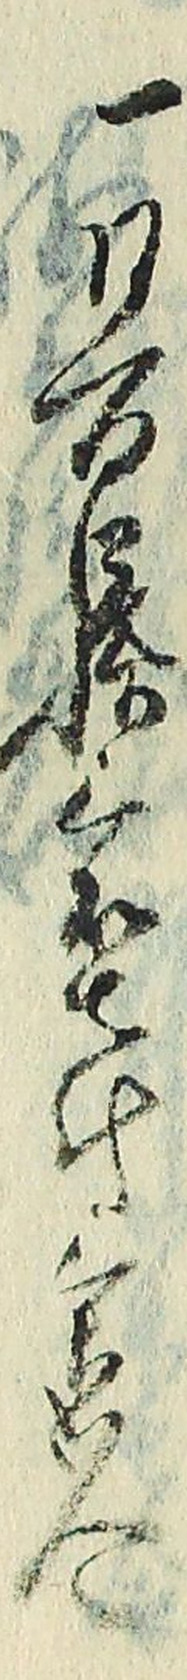一同百四拾三石七斗三升弐合
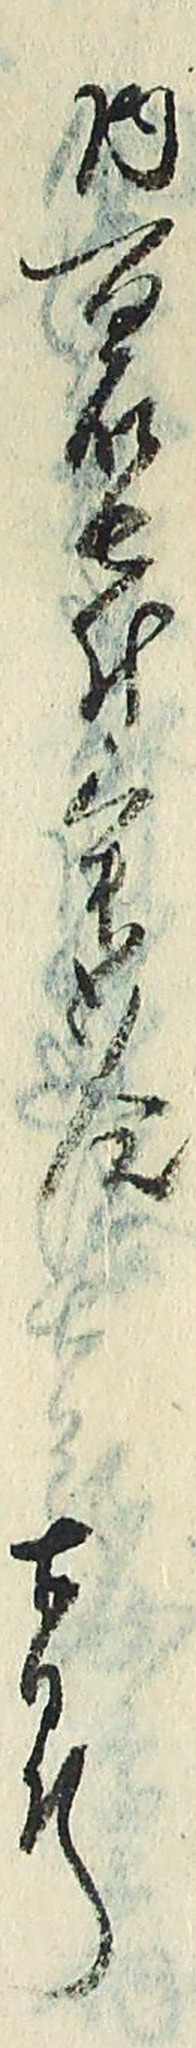内百石七斗三升弐合右同断
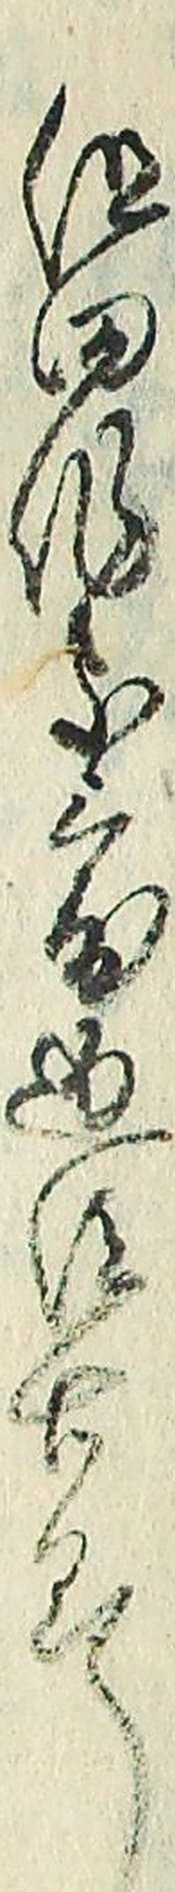但田作處三歩通位右同断

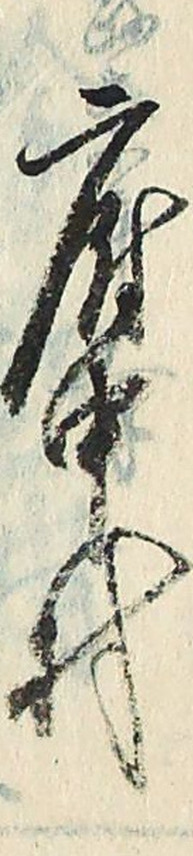府中村
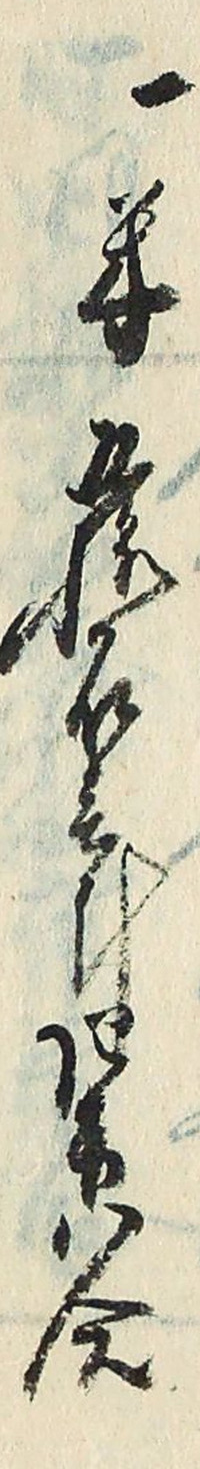一米五拾石壱斗四升八合
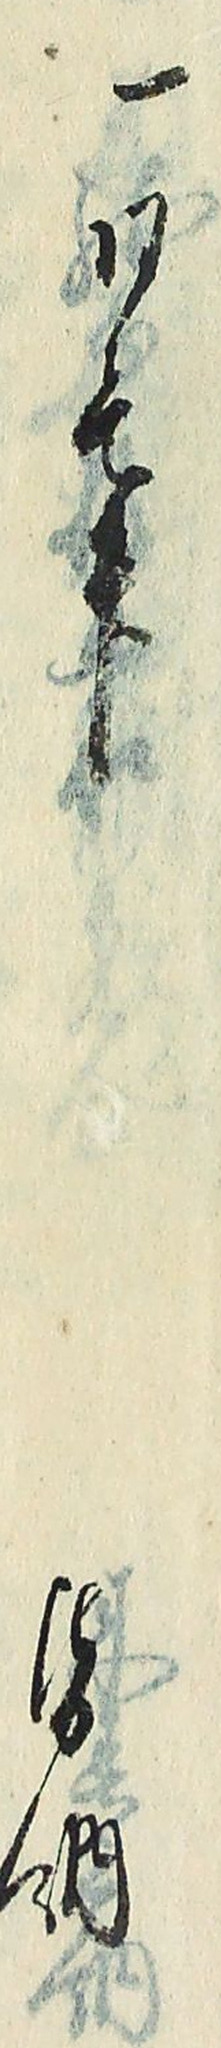一同壱升皆納
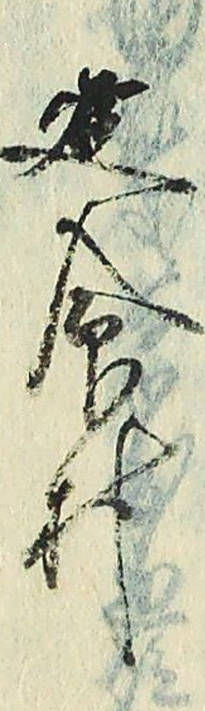延命村
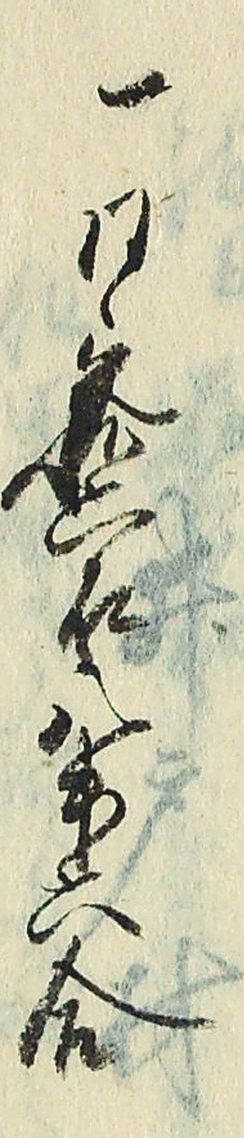一同三拾六石八升六合

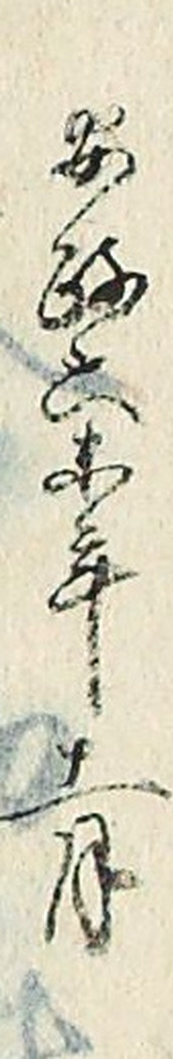安政六未年十一月
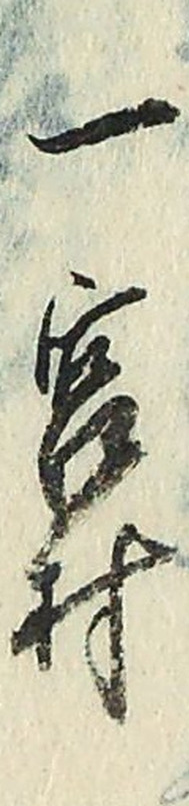一宮村
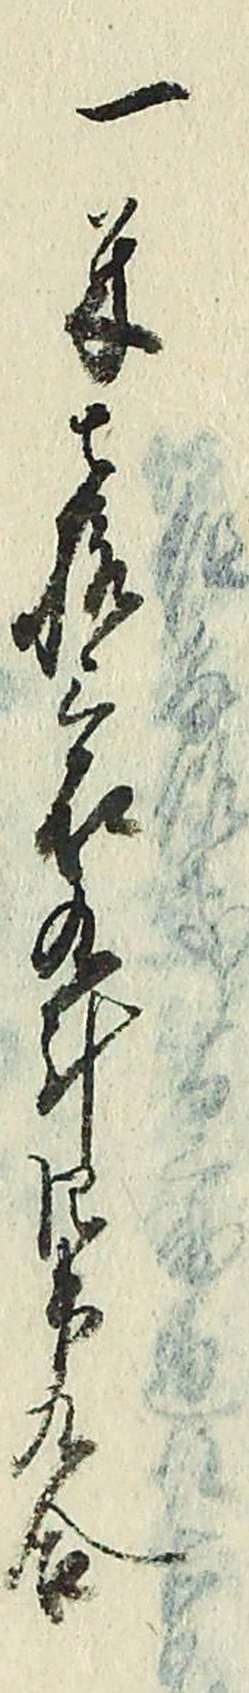一米七拾三石九斗四升九合
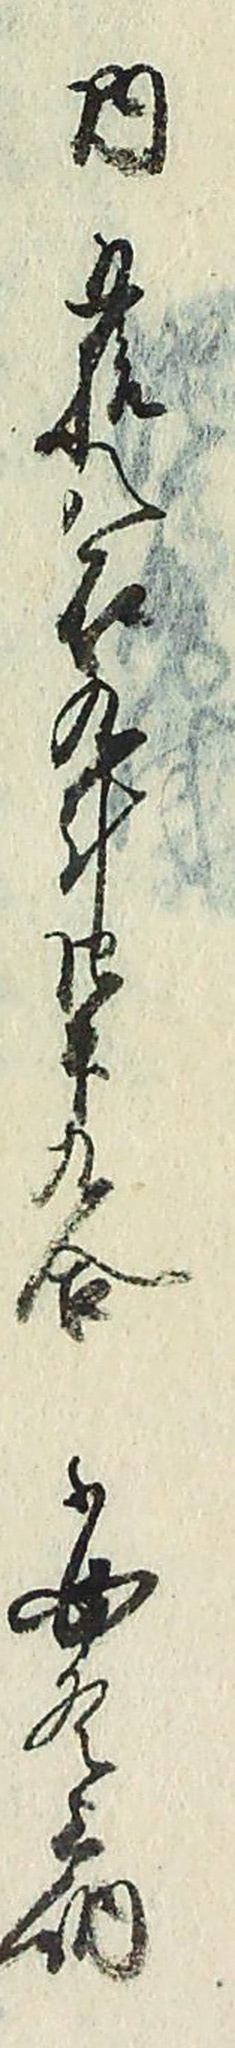内五拾八石九斗四升九合當冬上納
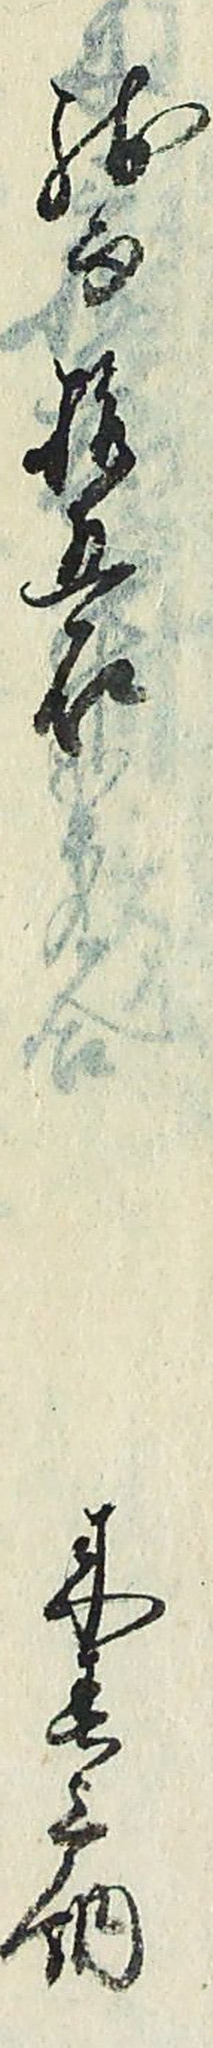残而拾五石来春上納
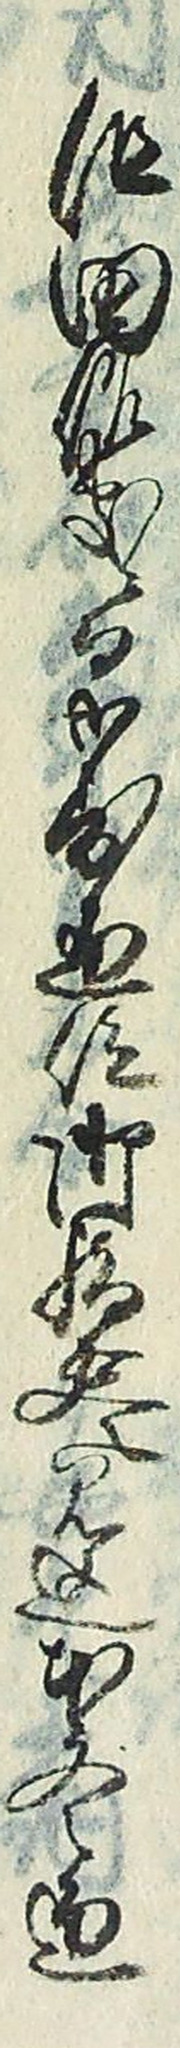但田作處ニ而弐歩通位御指延之見込本文之通
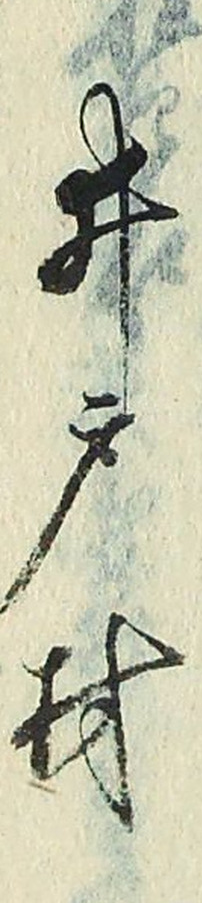井戸村
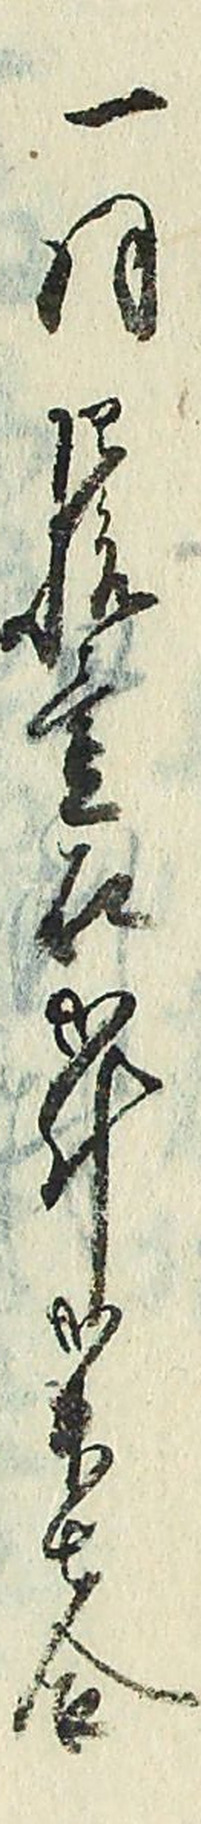一同四拾壹石弐斗弐升七合
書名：諸御趣意書并御下知向之写
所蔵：鳴門教育大学 Naruto University of Education
